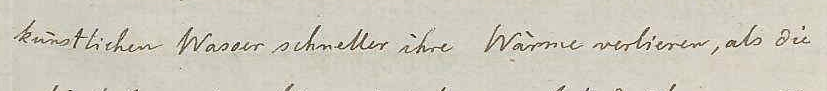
künstlichen Wasser schneller ihre Wärme verlieren, als die
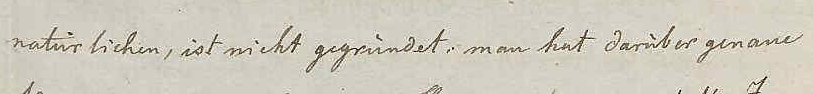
natürlichen, ist nicht gegründet: man hat darüber genaue
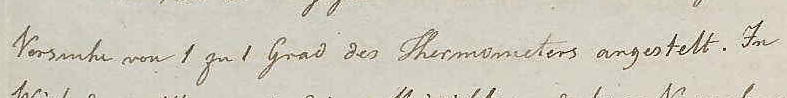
Versuche von 1 zu 1 Grad des Thermometers angestelt. In
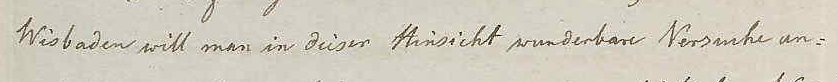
Wisbaden will man in dieser Hinsicht wunderbare Versuche an-
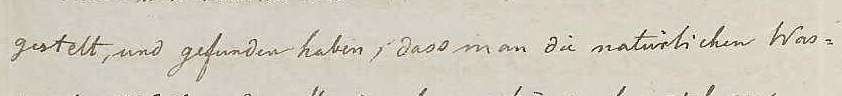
gestelt, und gefunden haben, dass man die natürlichen Was-
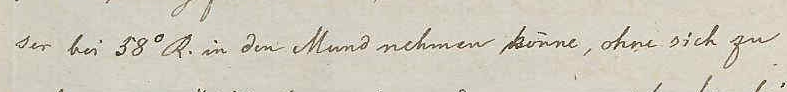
ser bei 58° R. in den Mund nehmen könne, ohne sich zu
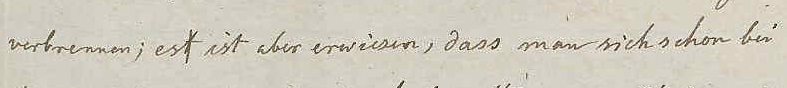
verbrennen; est ist aber erwiesen, dass man sich schon bei
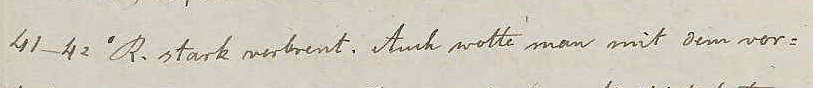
41–42° R. stark verbrent. Auch wolte man mit dem vor-
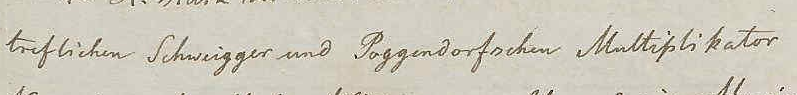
treflichen Schweigger und Poggendorfschen Multiplikator
